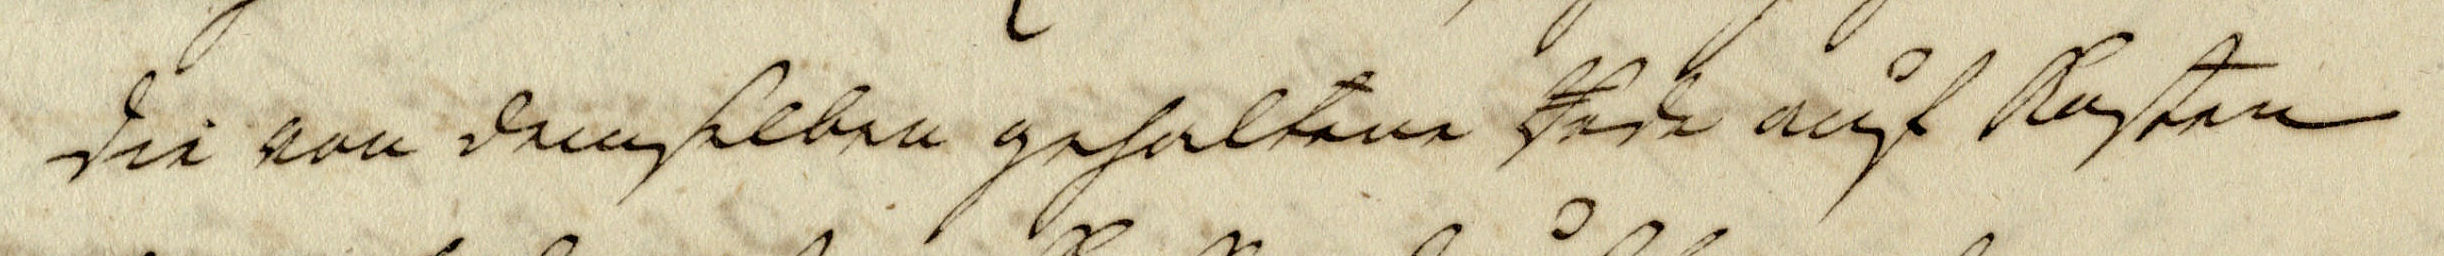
die von demselben gehaltene Rede auf Kosten
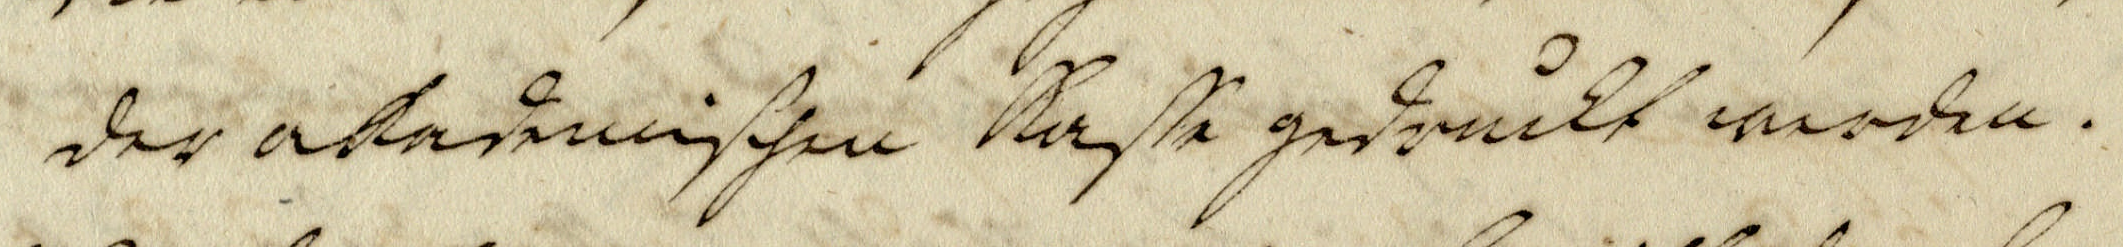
der akademischen Kasse gedruckt werden.
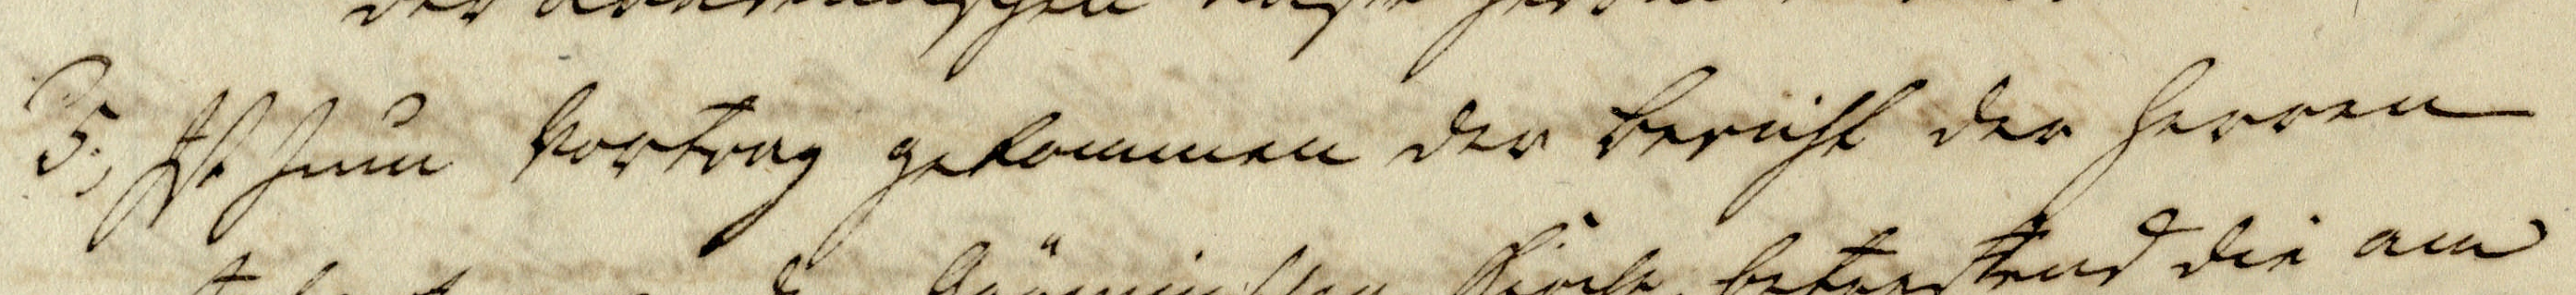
5, Ist zum Vortrag gekommen der Bericht der Herren
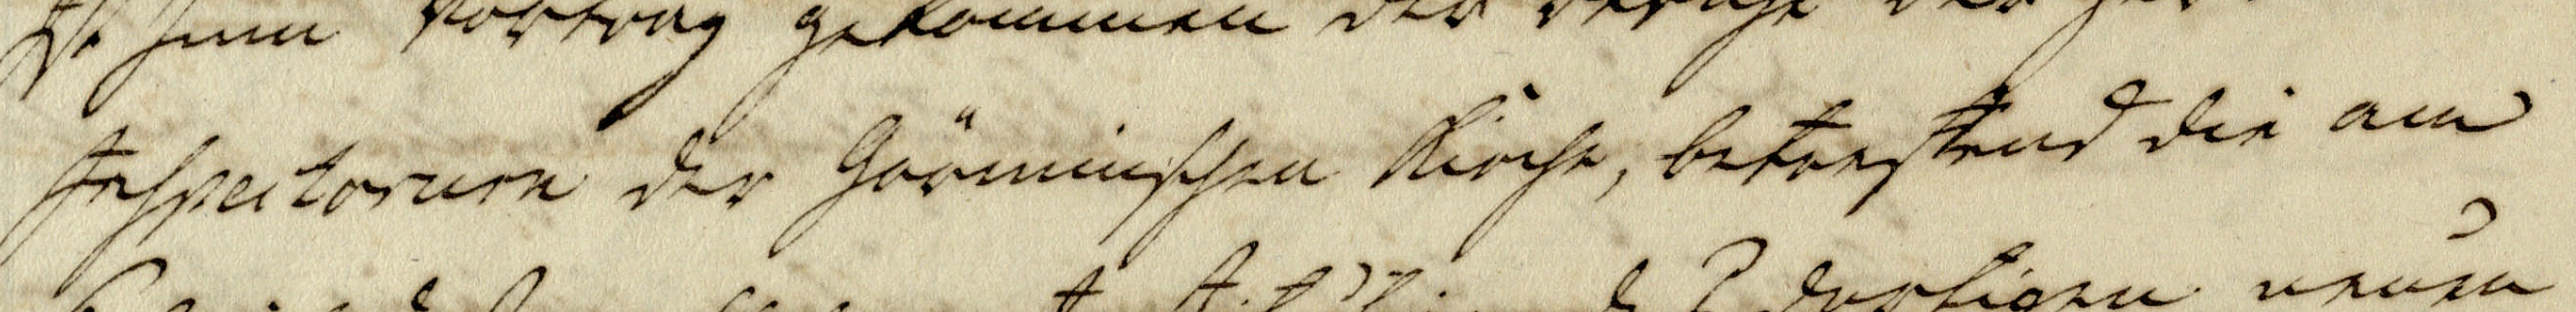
Inspectorum der Görminschen Kirche, betreffend die am
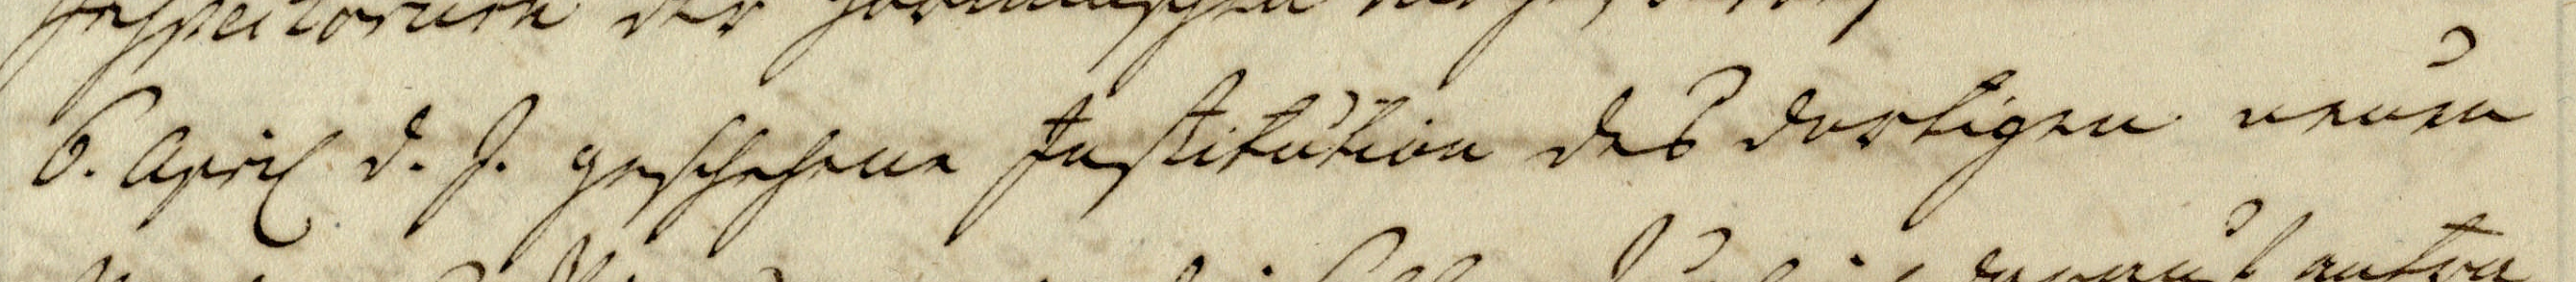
6. April d. J. geschehene Institution des dortigen neuen
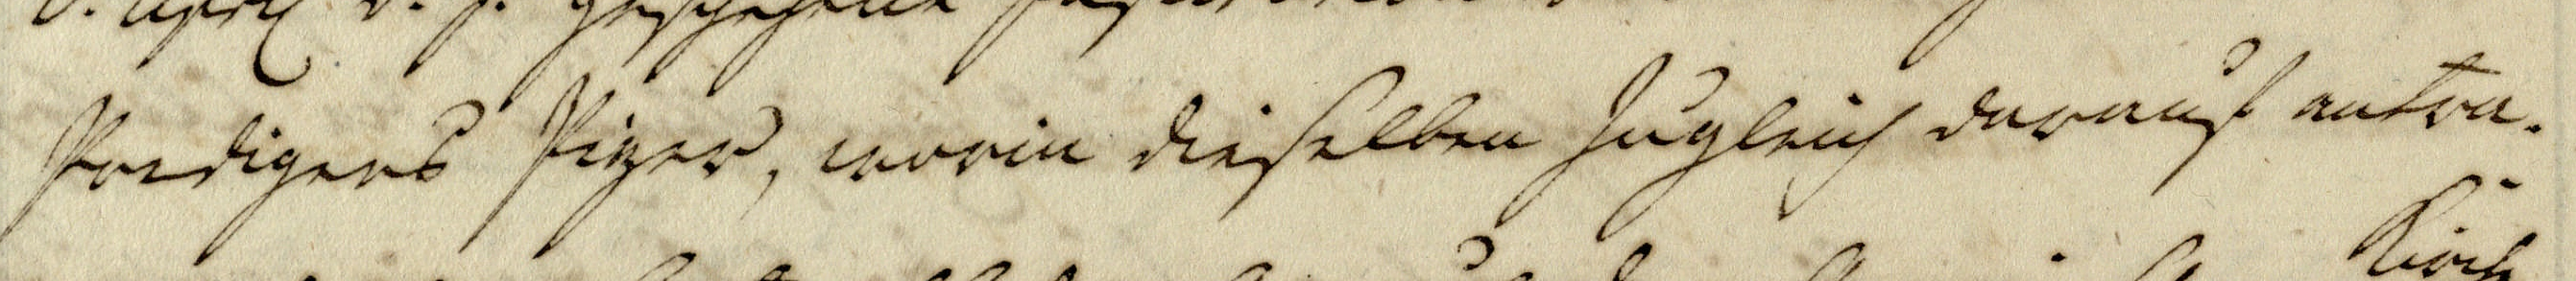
Predigers Piper, worin dieselben zugleich darauf antra¬
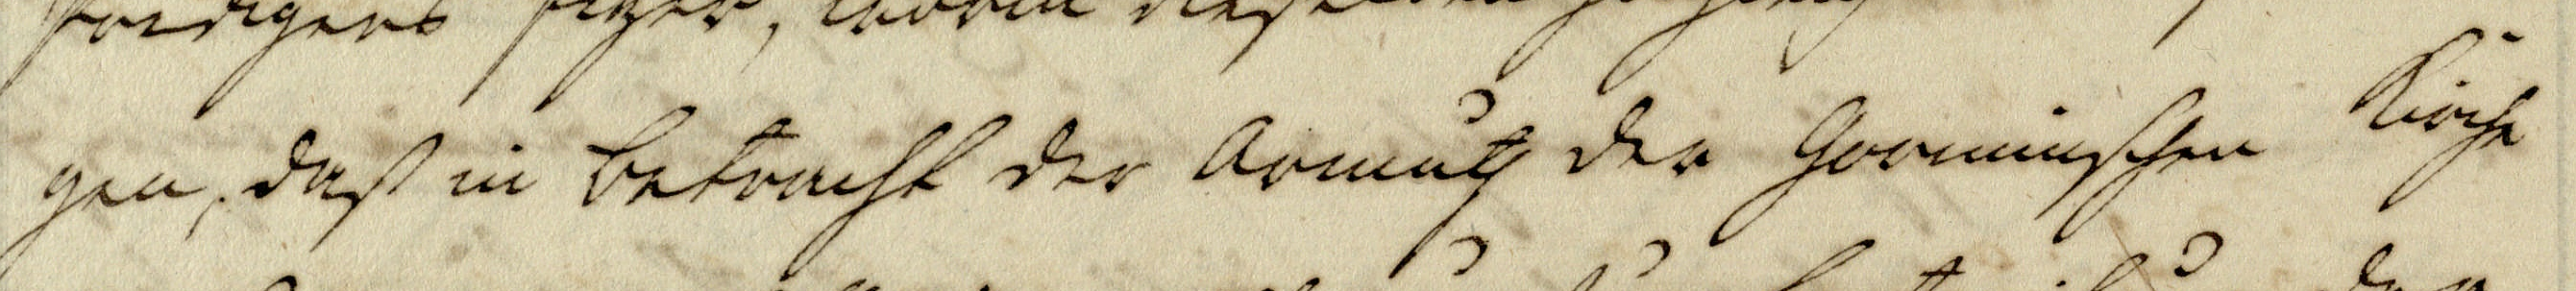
gen, daß in Betracht der Armuth der Gormnischen Kirche
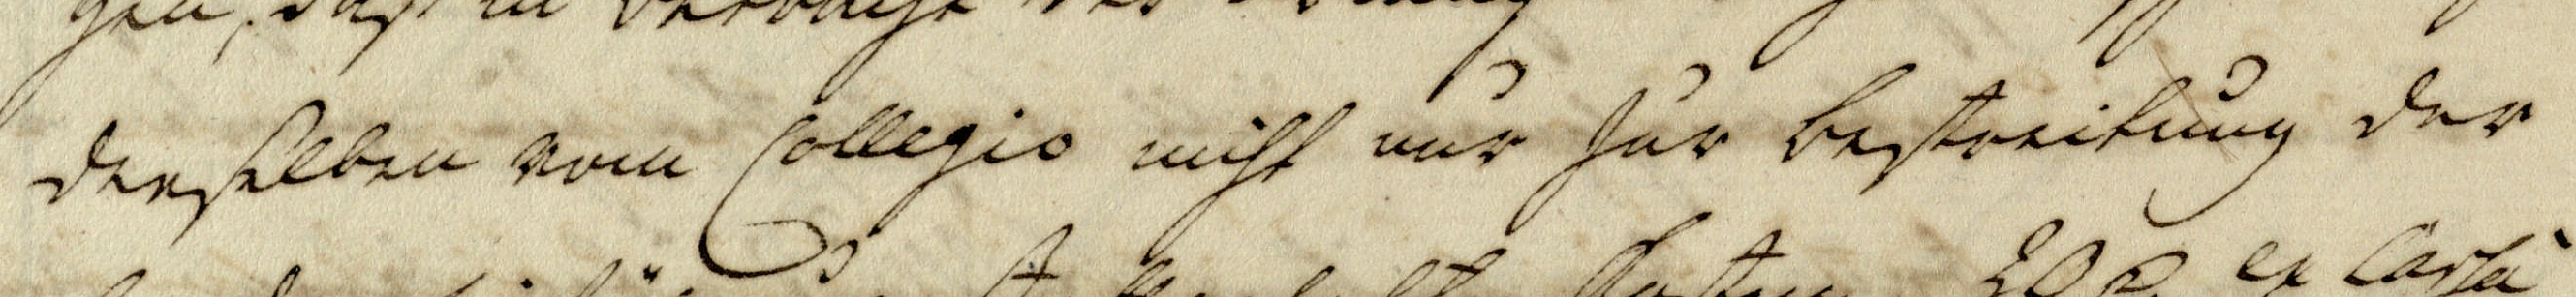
derselben vom Collegio nicht nur zur Bestreitung der
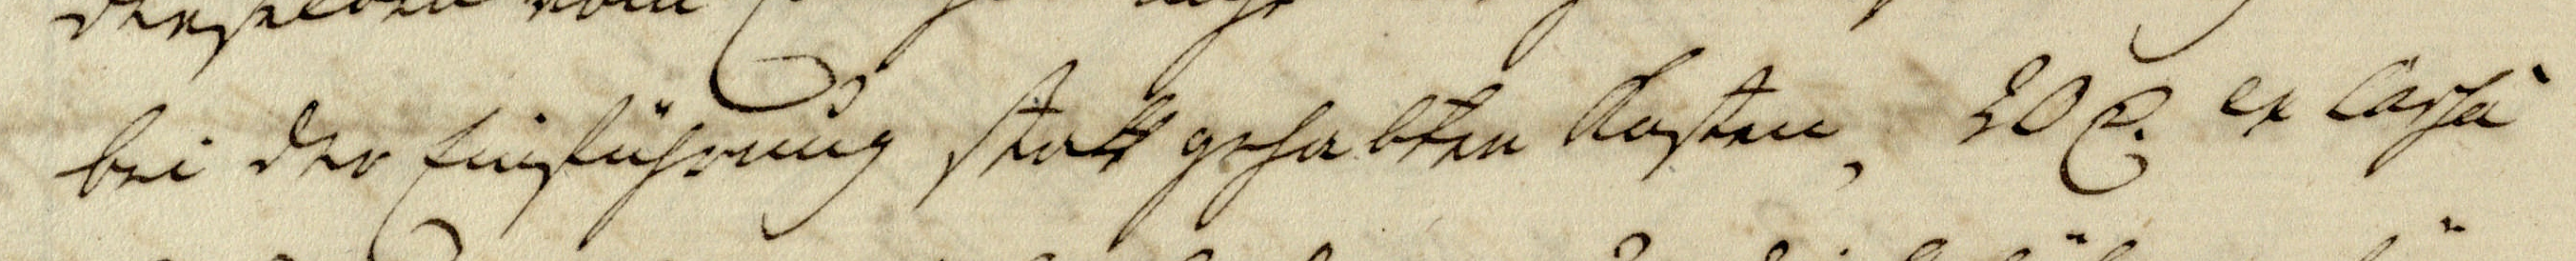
bei der Einführung statt gehabten Kosten 20 l. ex cassa
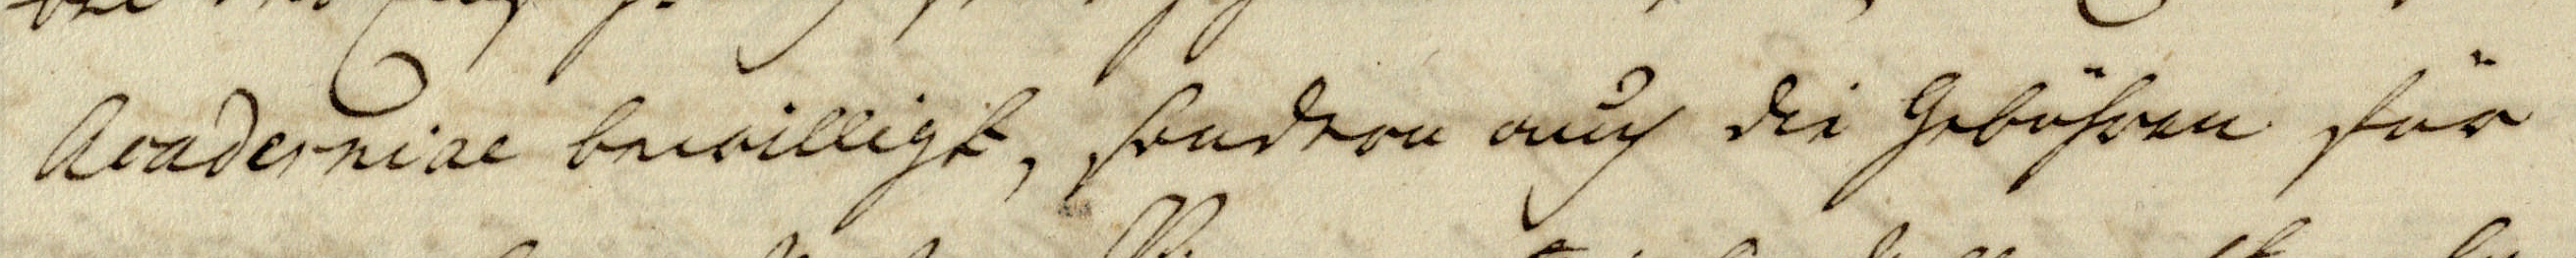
Academiae bewilligt, sondern auch die Gebühren für
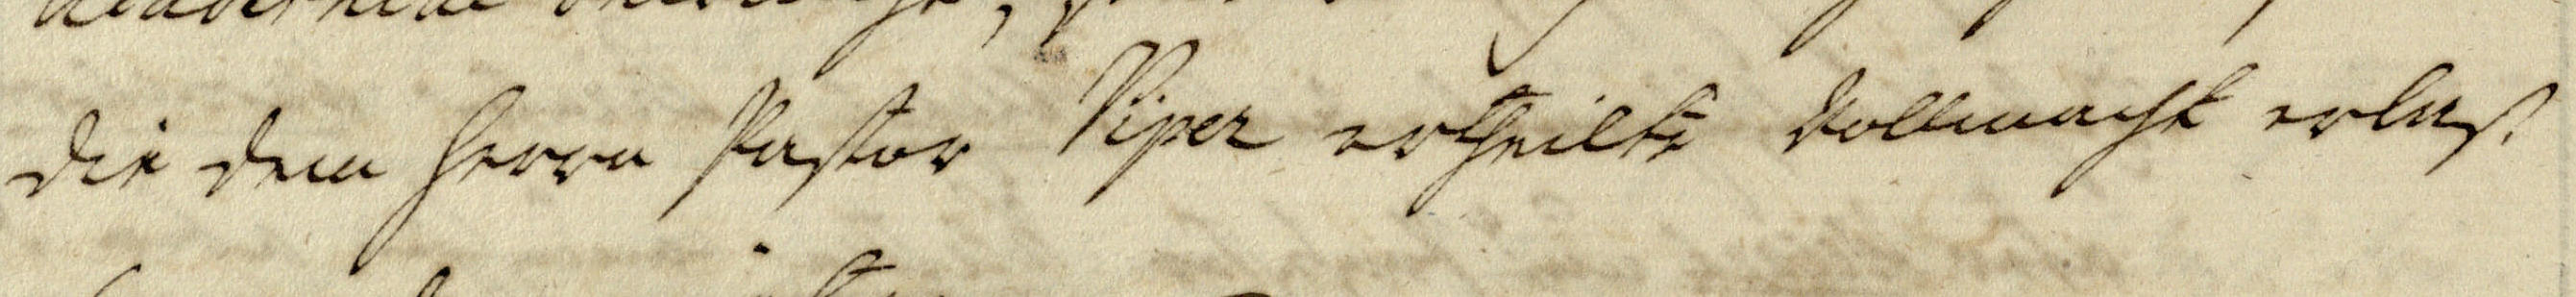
die dem Herrn Pastor Piper ertheilte Vollmacht verlas¬
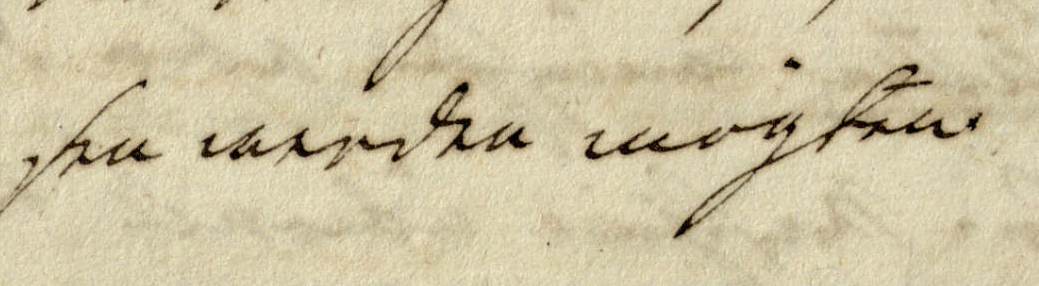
sen werden mögten.
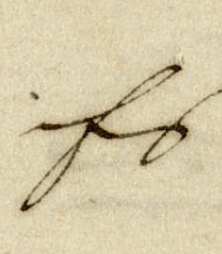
Es
